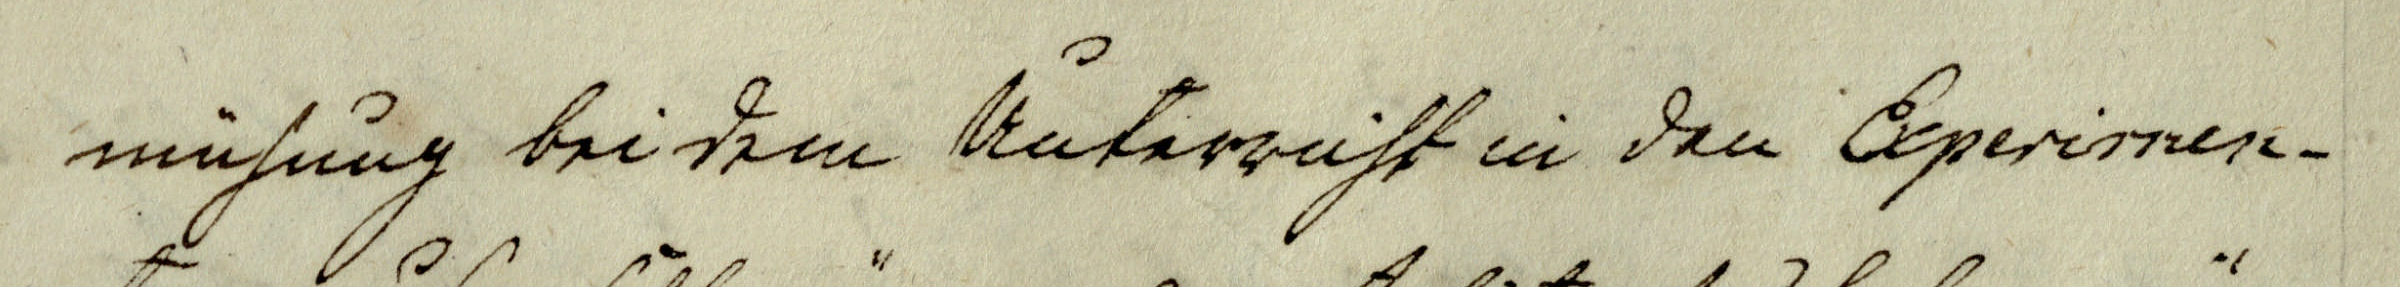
mühung bei dem Unterricht in den Exeperimen¬
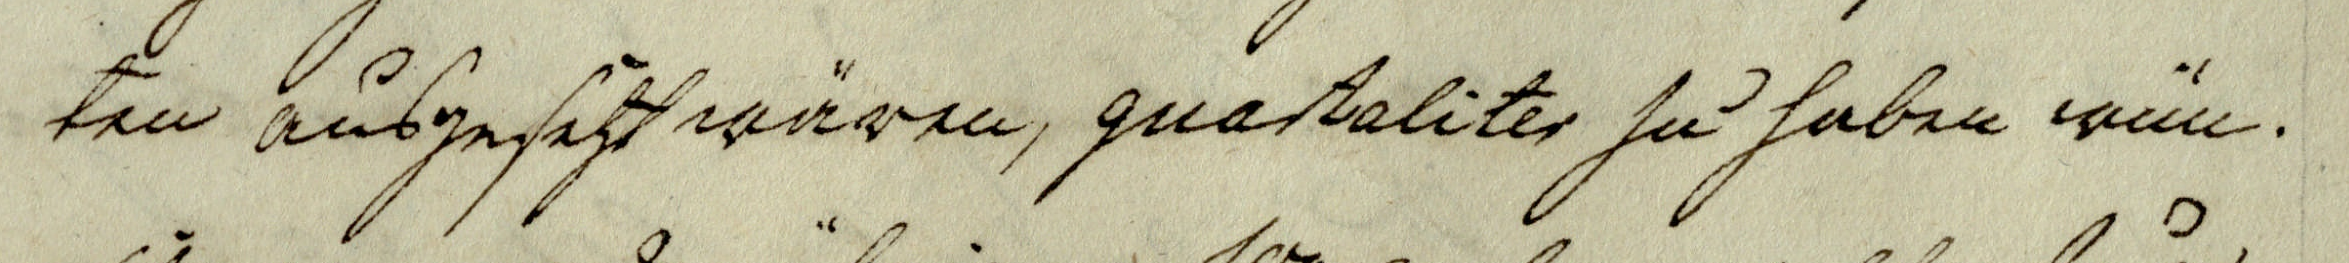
ten ausgesetzt wären, quartaliter zu haben wün¬
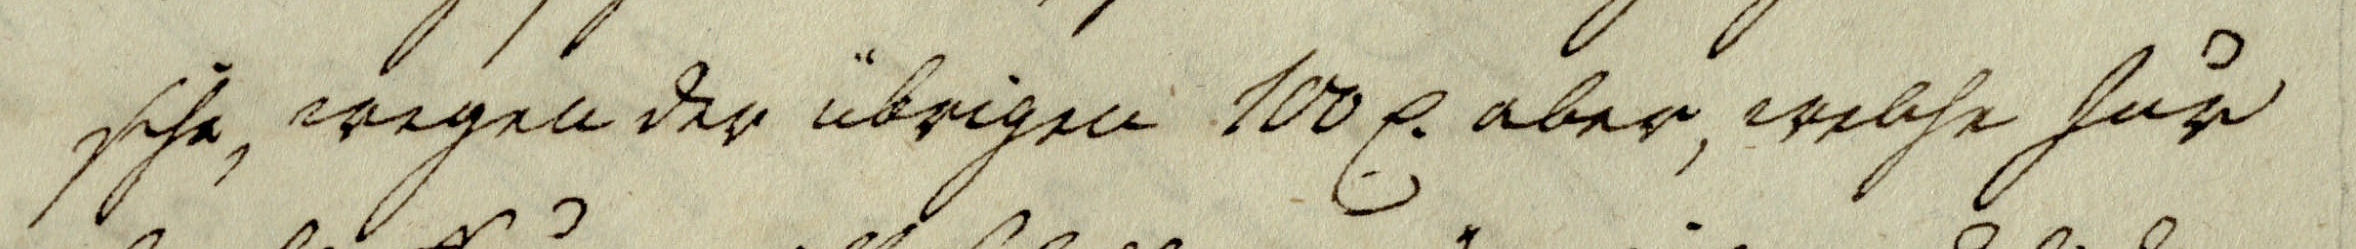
sche, wegen der übrigen 100 l. aber, welche zur
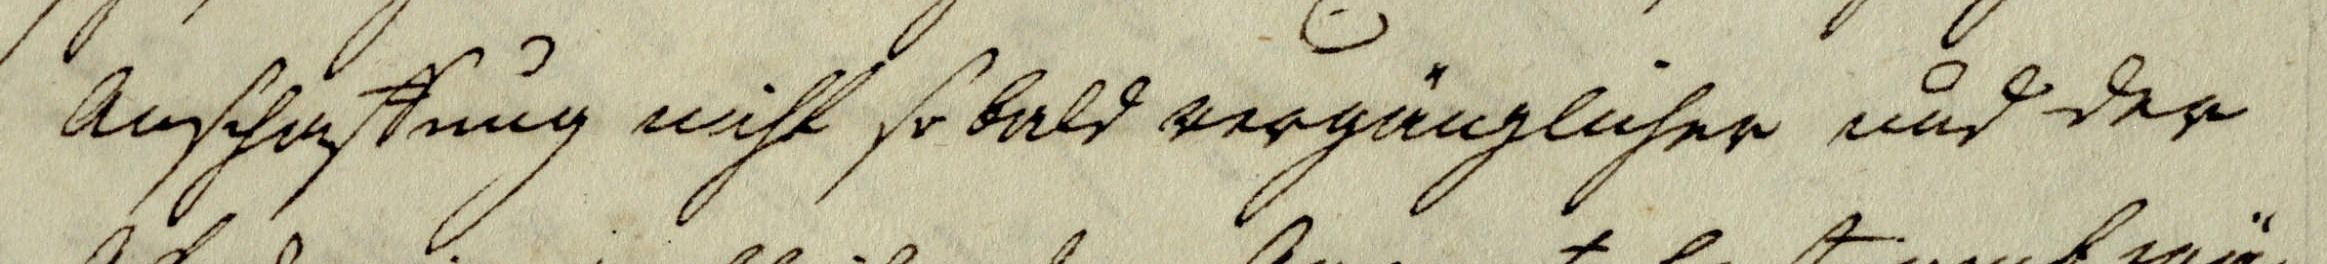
Anschaffung nicht so bald vergänglicher und der
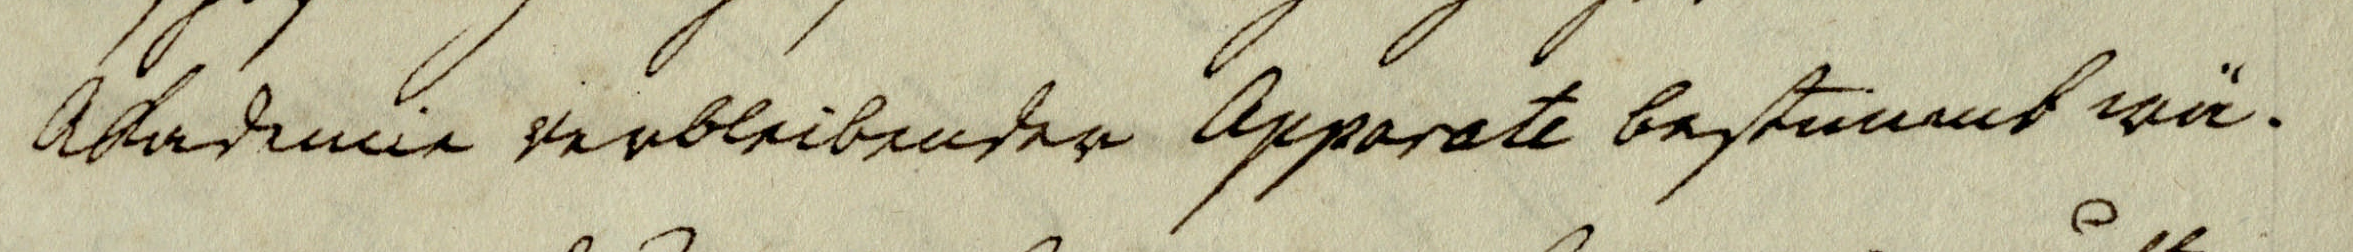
Akademie verbleibender Apparate bestimmt wä¬
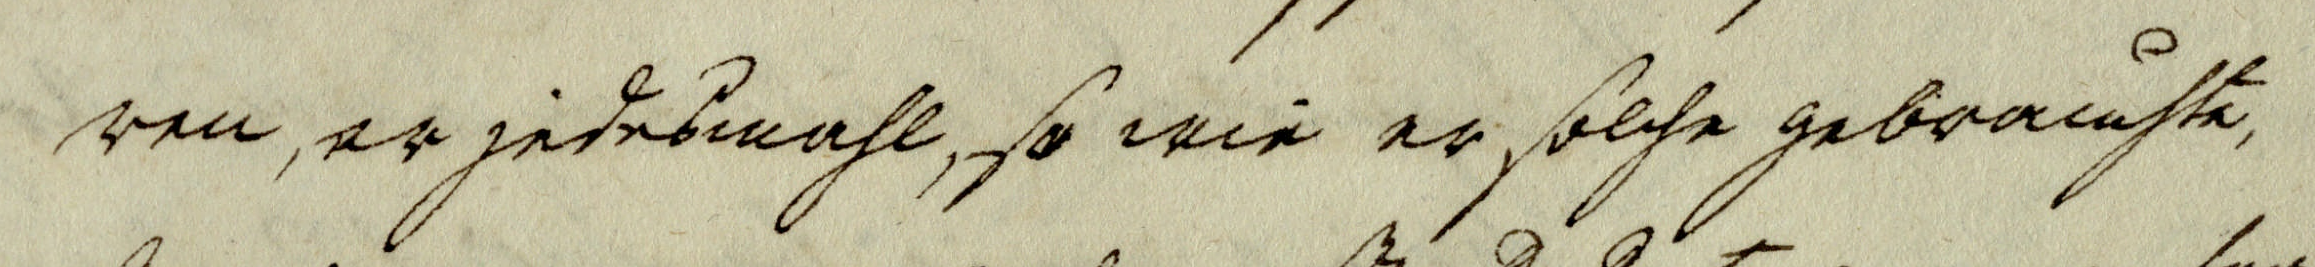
ren, er jedesmahl, so wie er solche gebrauchte,
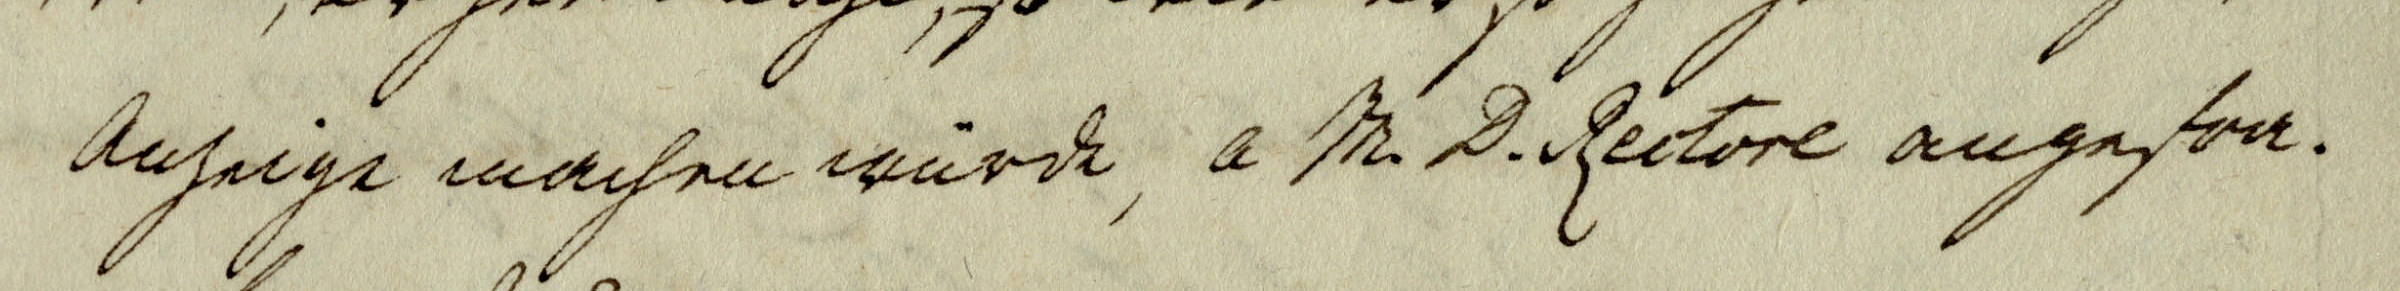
Anzeige machen würde, a M. D. Rectore angefra¬
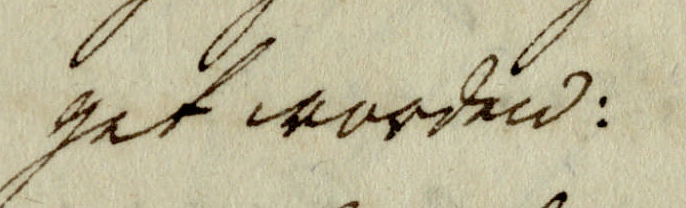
get worden:.
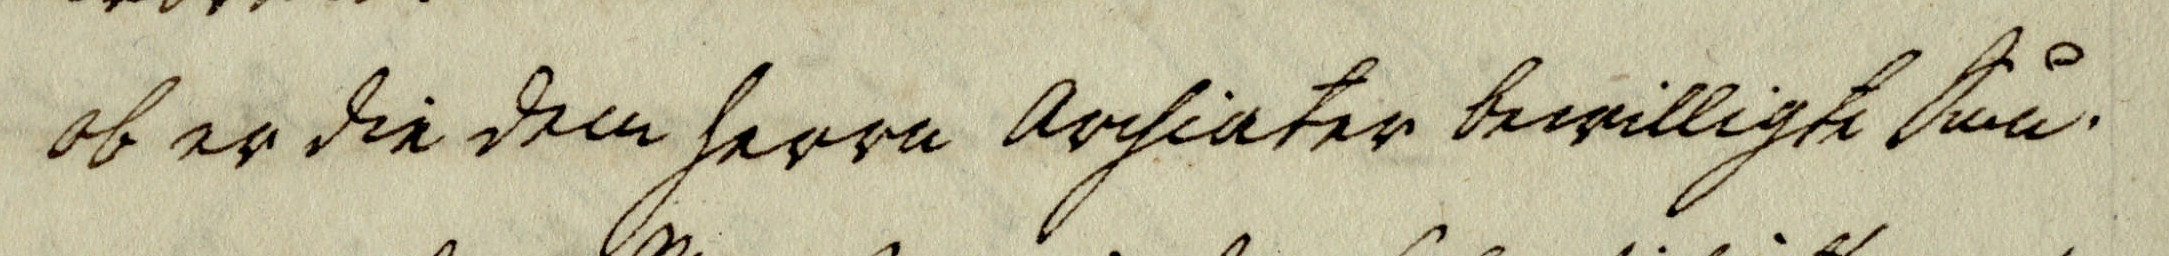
ob er die dem Herrn Archiater bewilligte Sum¬
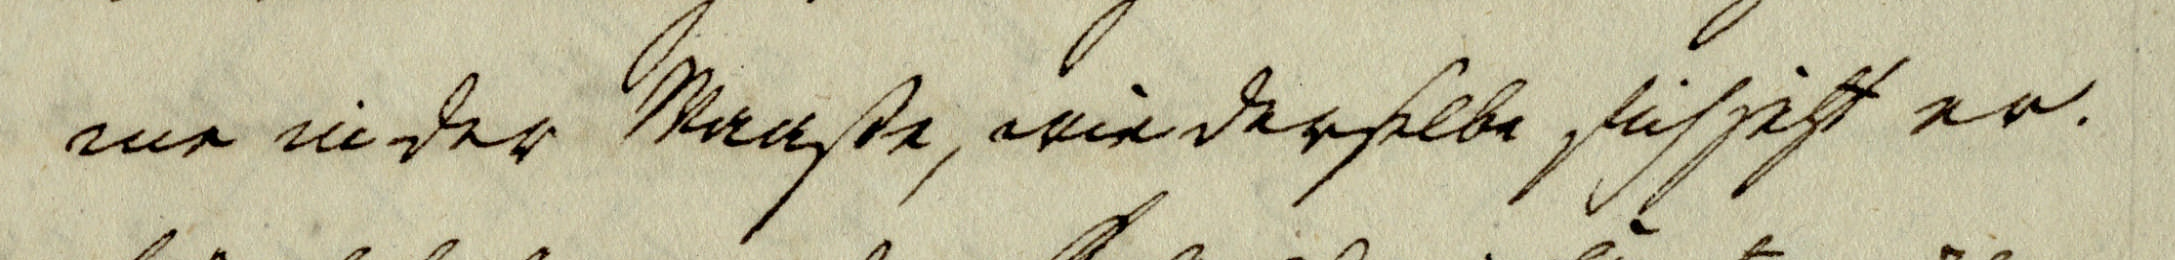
me in der Maaße, wie derselbe sich jetzt er¬
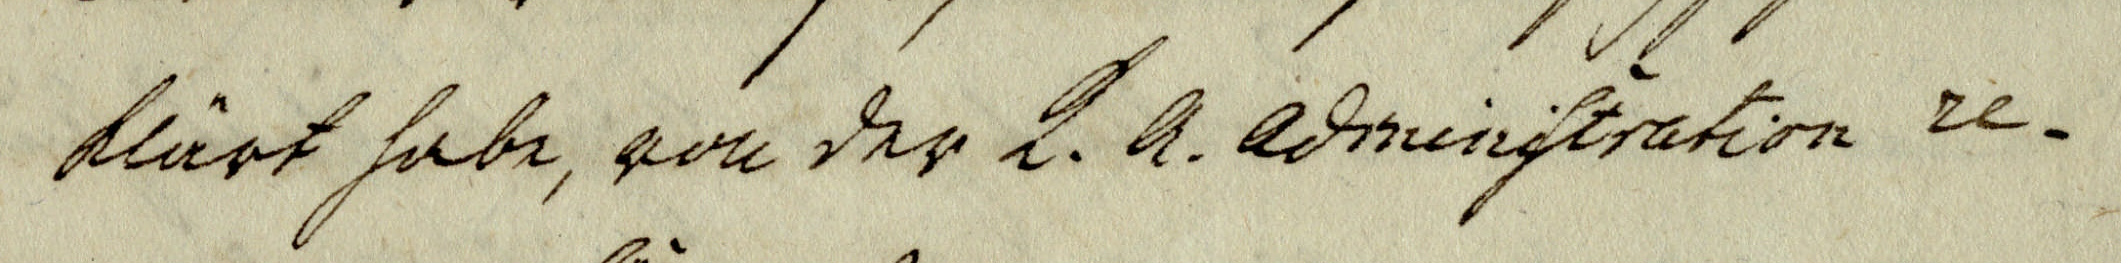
klärt habe, von der K. A. Administration re¬
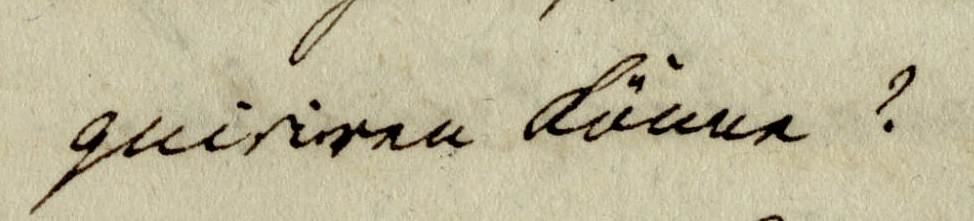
quiriren könne?
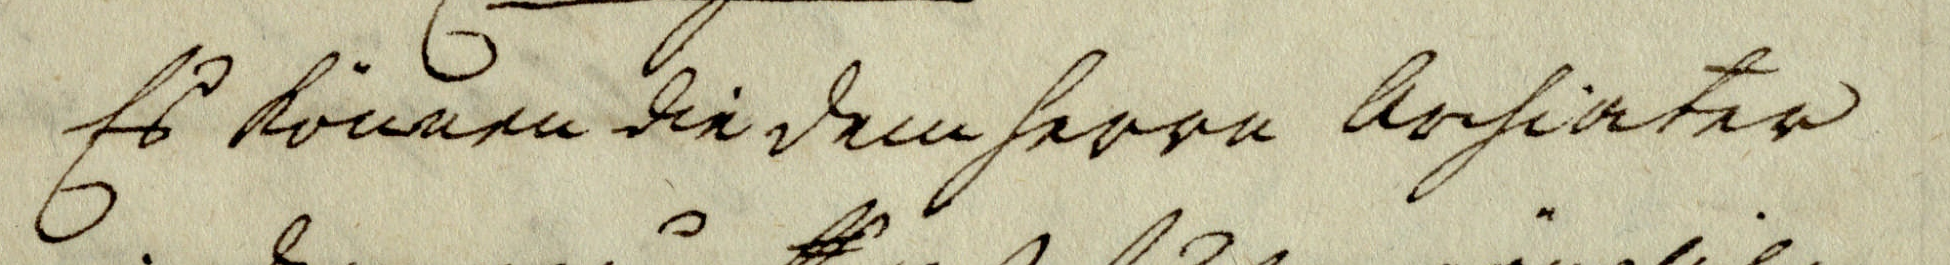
Es können die dem Herrn Archiater
